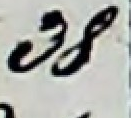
38
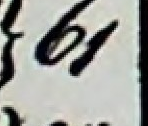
61
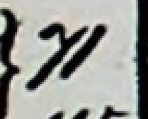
71
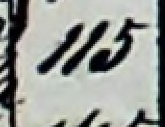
115
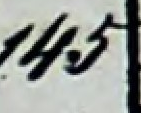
145
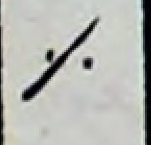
./.
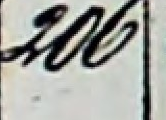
206
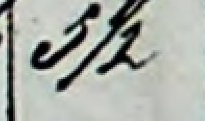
5 1/2
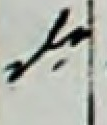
Do
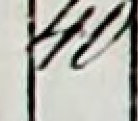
40
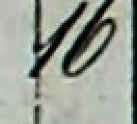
16
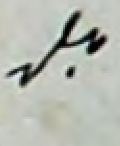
Do
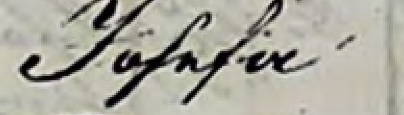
Josefa
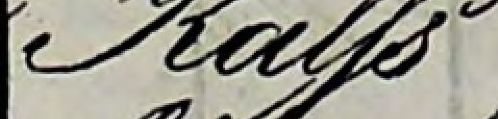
Kalss
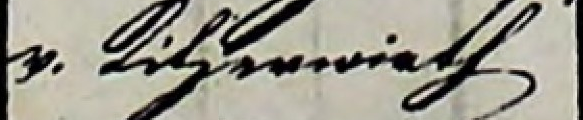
v. Kitzerwirth
